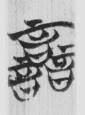譶
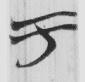于
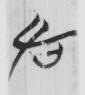左
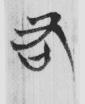右
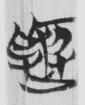𪴿
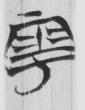𩁹
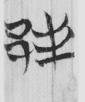邦
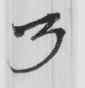乃
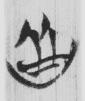皆
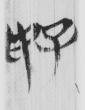好
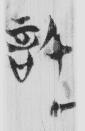信
